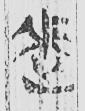麥
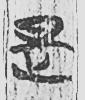是
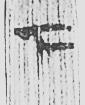下
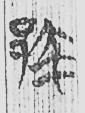○（蔡）
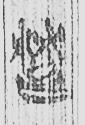楚
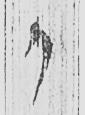人
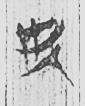𡚦
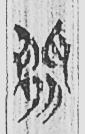{門夕刀}
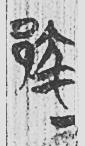○（蔡）
